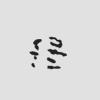是
